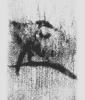五
